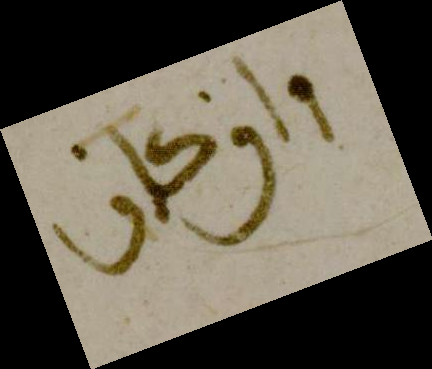وان كان
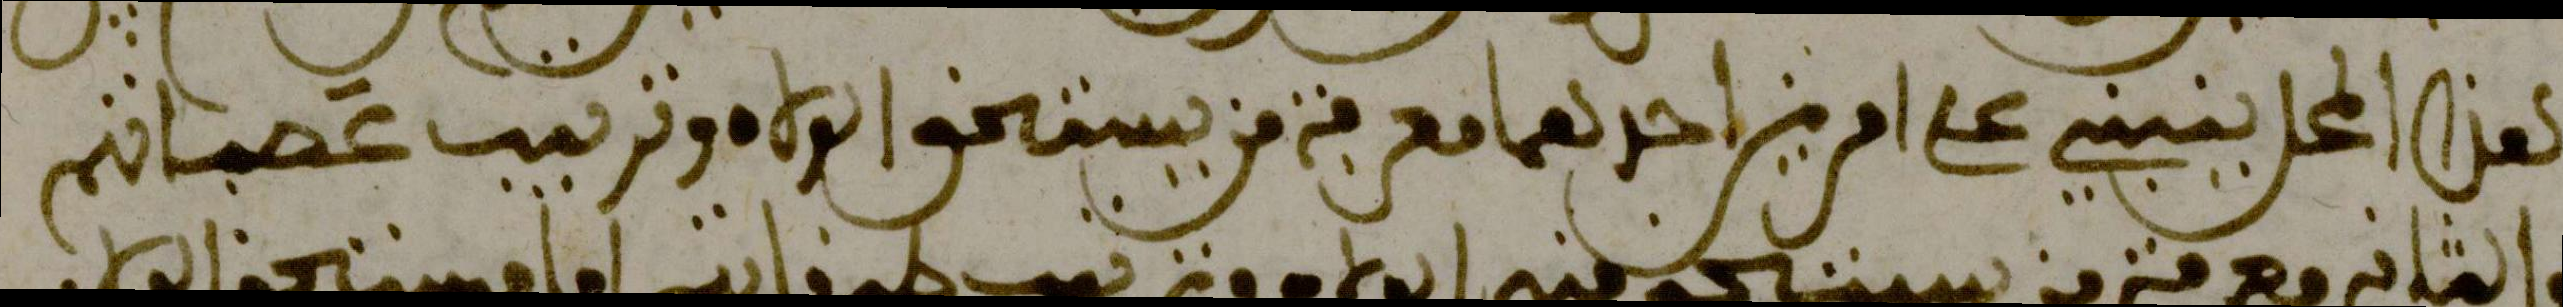هذا المحل ينبني على امرين احدهما معرفة من يستحق الولاء وترتيب عصباتهم
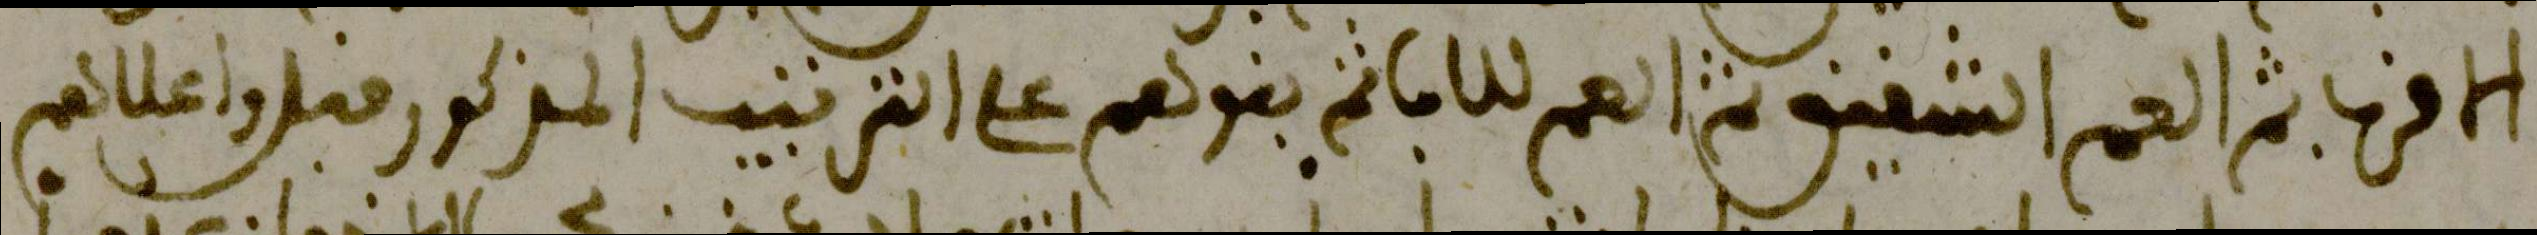الاقرب ثم العم الشقيق ثم العم للاب ثم بنوهم على الترتيب المذكور قبل واعلاهم
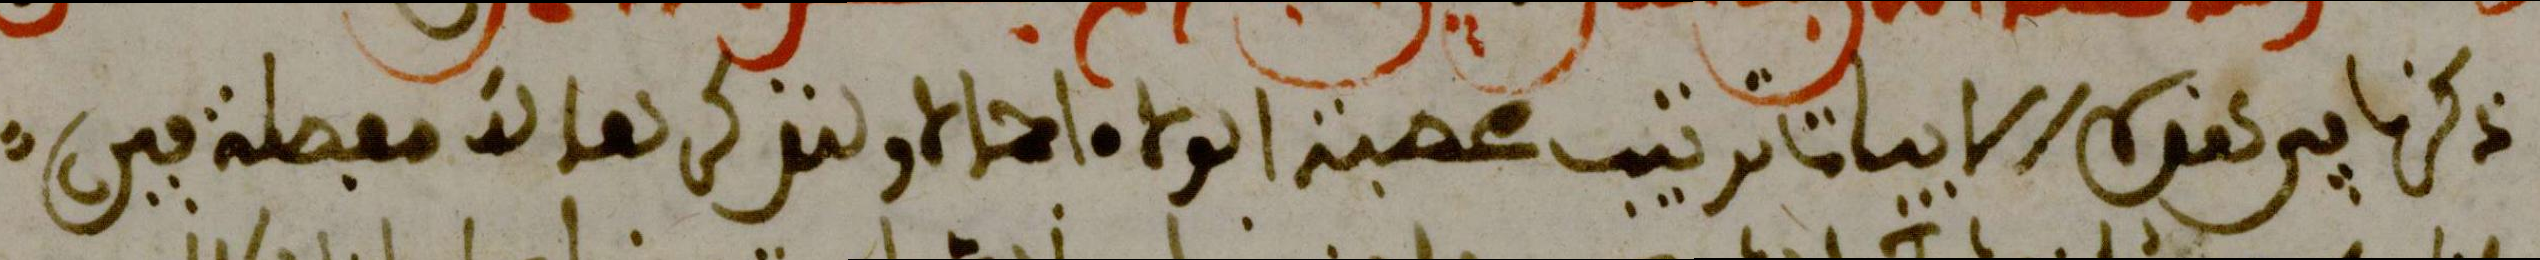ذكرنا في هذه الابيات ترتيب عصبة الولاء اجمالا ولنذكرها لك مفصلة في
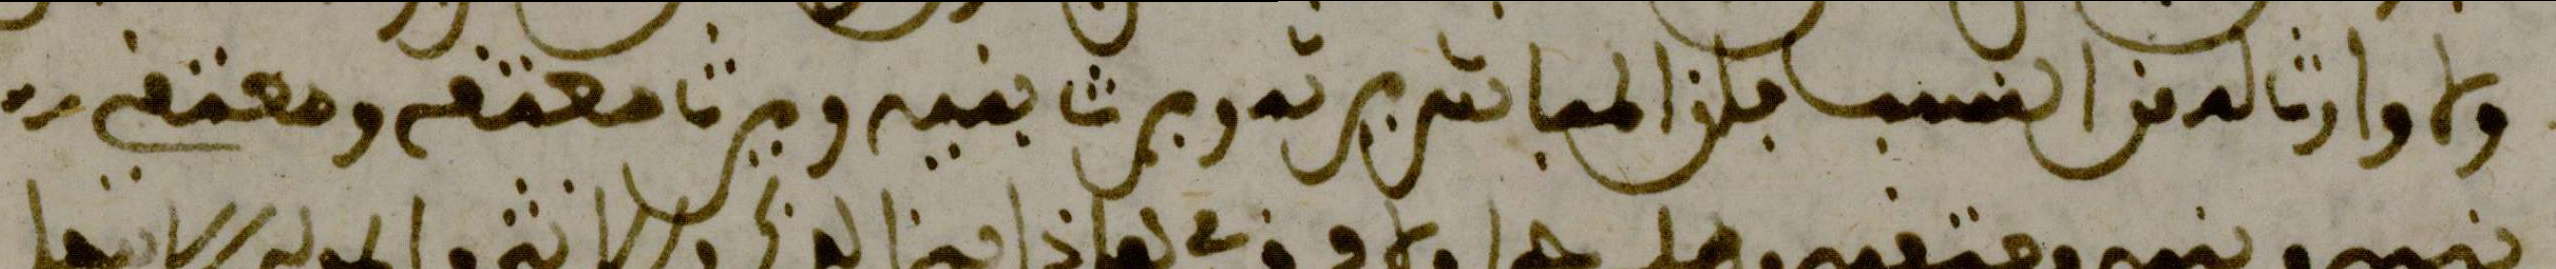ولا وارث له من النسب فان المباشر يرثه يرث بنيه ويرث معتقه ومعتقي
